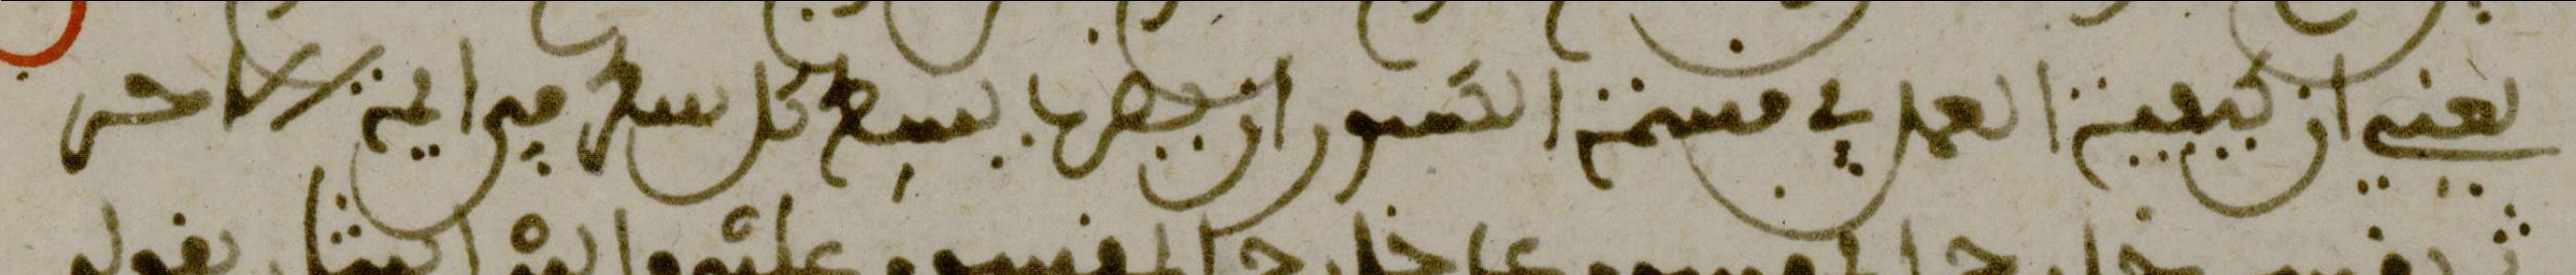يعني ان كيفية العمل في قسمة الكسور ان يضرب بسط كل سطر في ايمة الاخر
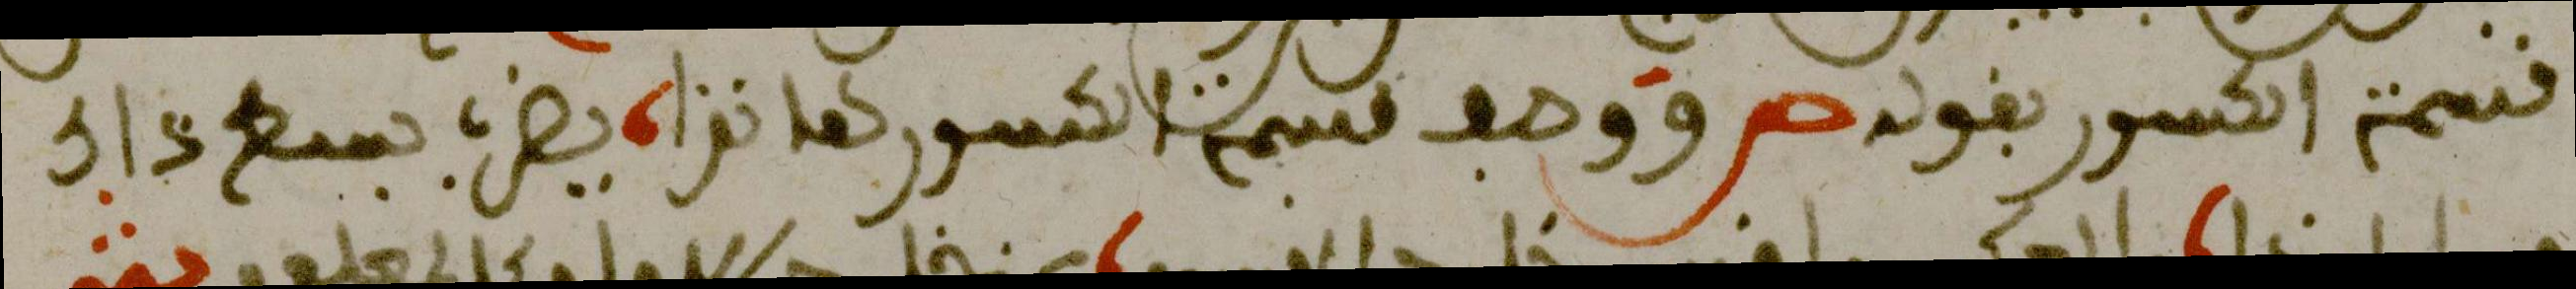قسمة الكسور بقوله ص و وصف قسمة الكسور هاكذا يضرب بسط ذاك
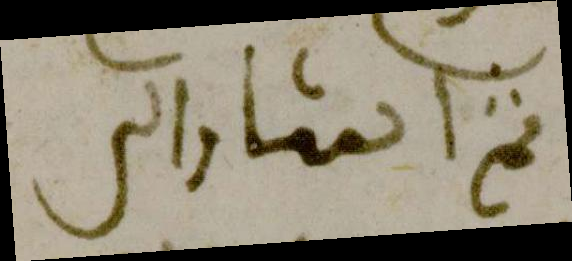ثم اشار الى
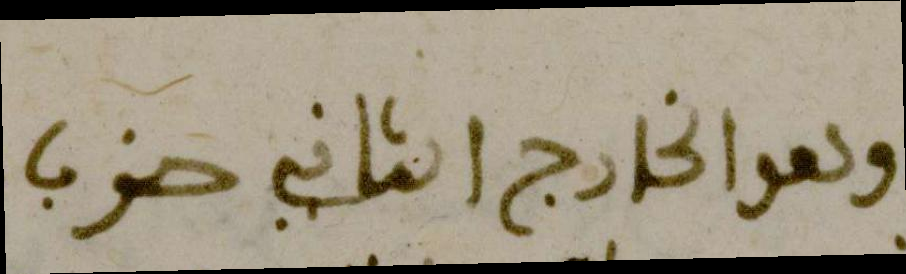و هو الخارج الثاني ضرب
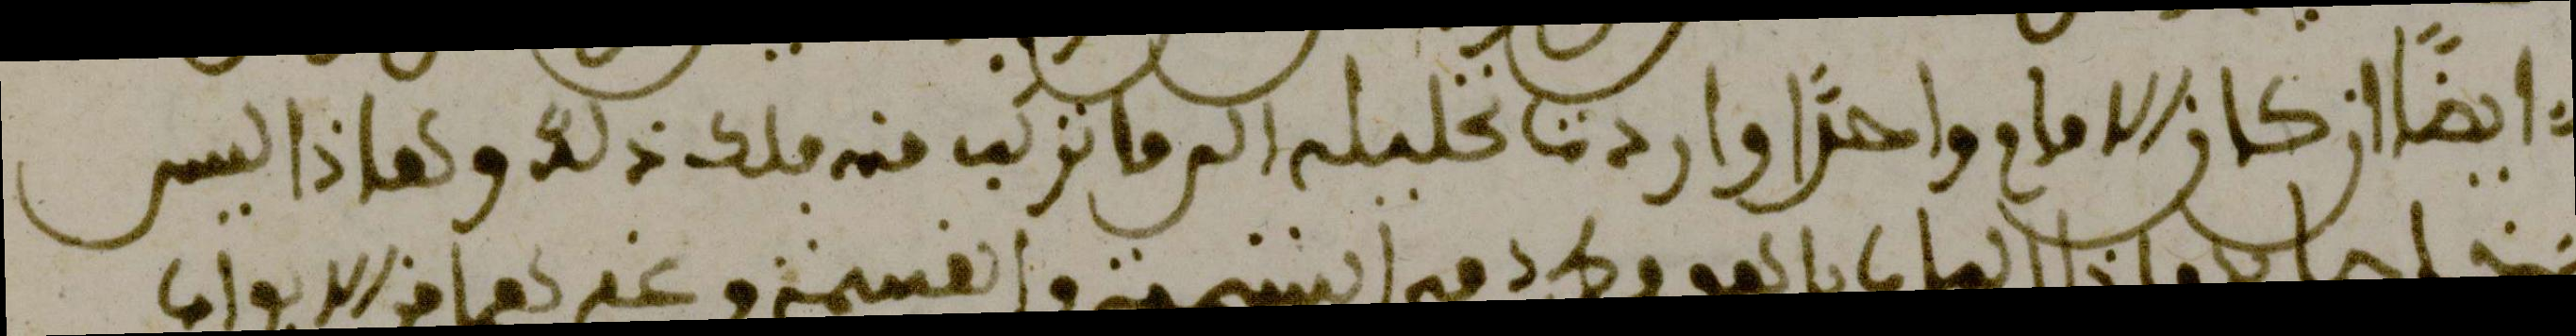ايضا ان كان الامام واحدا و اردت تحليله الى ما تركب منه فلك ذلك و هذا ليس
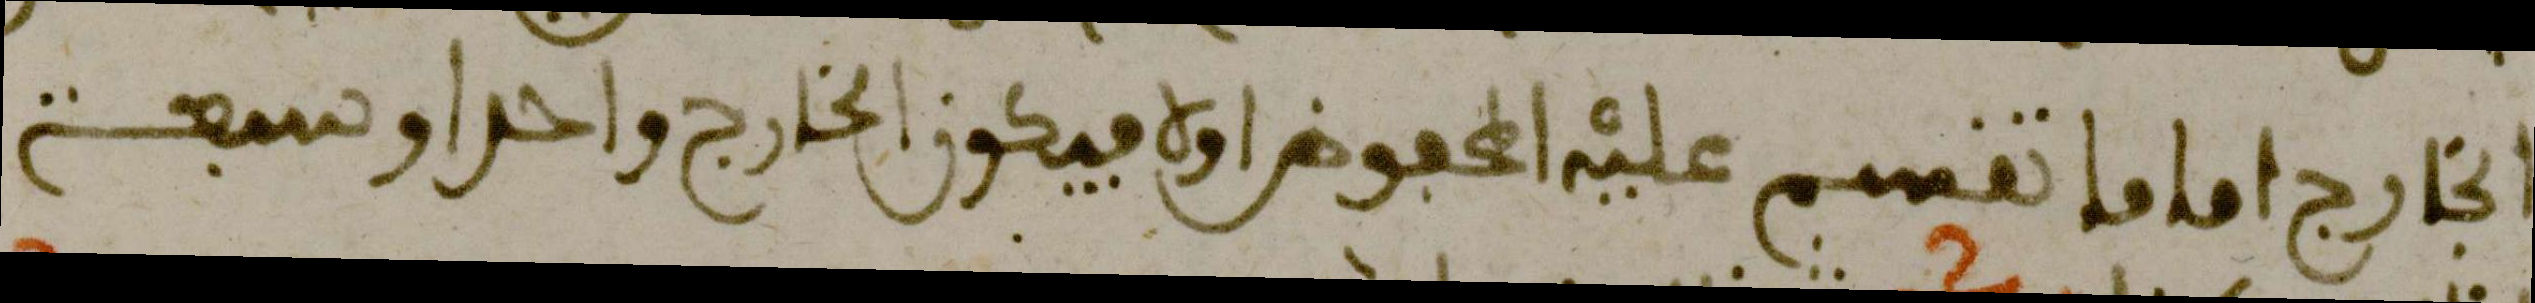الخارج اماما تقسم عليه المحفوض اولا فيكون الخارج واحدا و سبعة
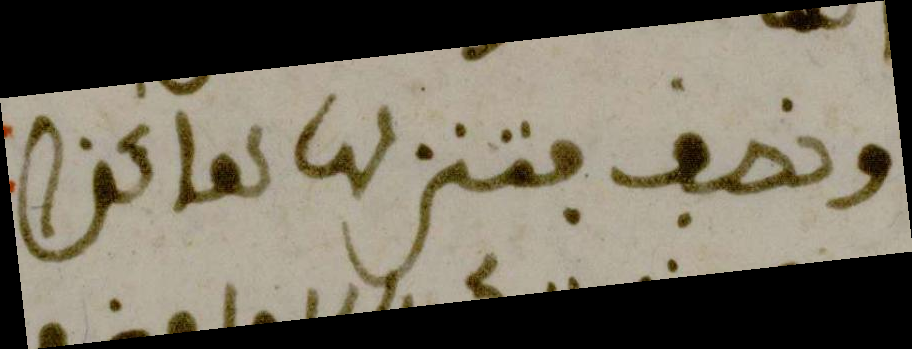و نصف فتنزلها هاكذا
